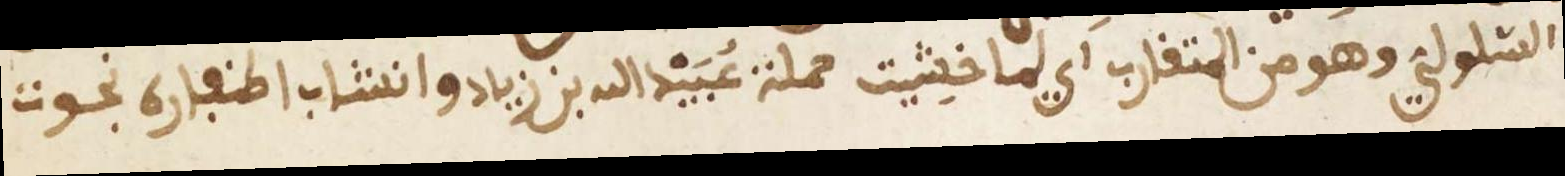السلولي و هو من المتقارب اي لما خشيت حملة عبيد اللَّه بن زياد و انشاب اظفاره نجوت
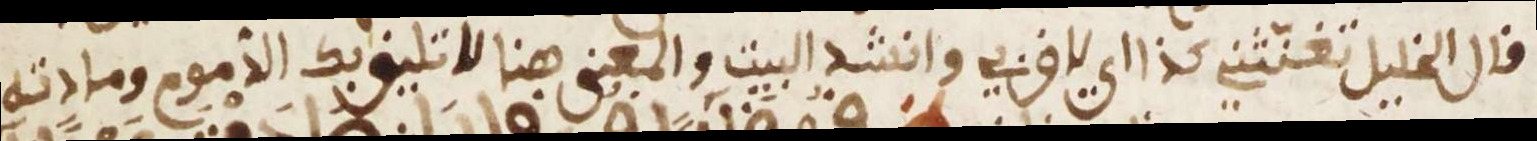قال الخليل تغنثني كذا اي لاق بي و انشد البيت و المعنى هنا لا تليق بك الذموم و مادته
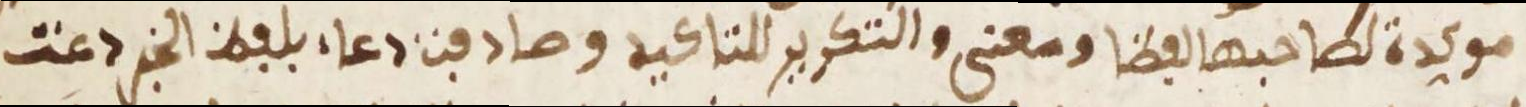موكدة لصاحبها لفظا و معنى و التكرير للتاكيد و صادفت دعاء بلفظ الخبر دعت
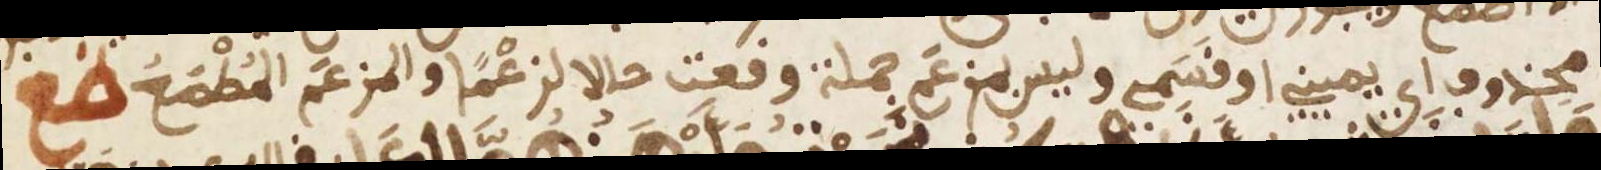محذوف اي يميني او قسمي و ليس بمزعم جملة وقعت حالا لزعما و المزعم المطمع ظع
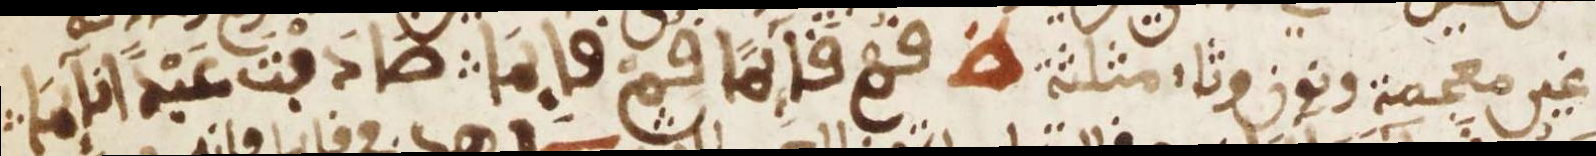غير معجمة و نون و ثاء مثلثة ظ قم قائما قم قائما صادفت عبدا نائما
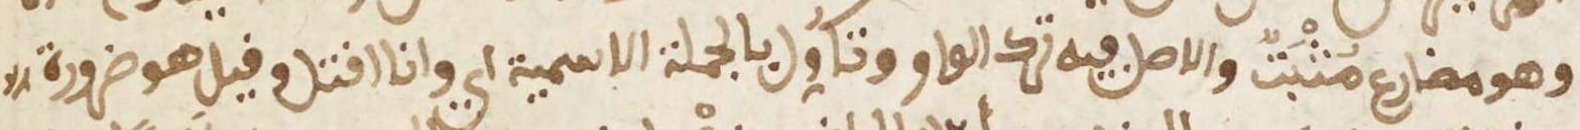و هو مضارع مثبت و الاصل فيه ترك الواو و تاول بالجملة الاسمية اي و انا اقتل و قيل هو ضرورة
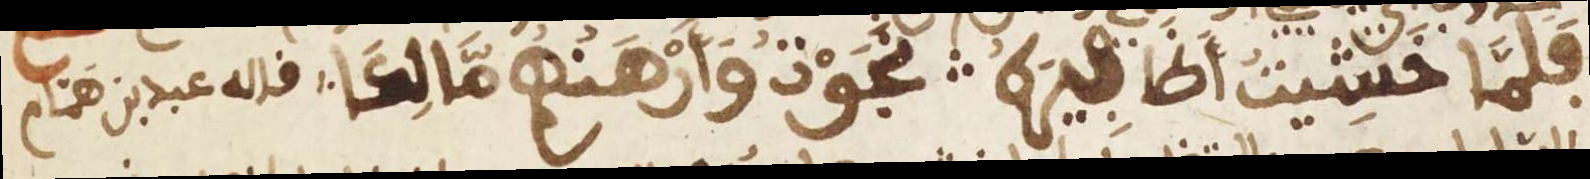فلما خشيت أظافيره نجوت و أرهنهم مالكا قاله عبد بن همام
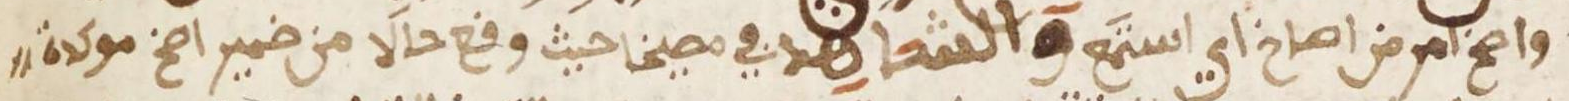و اصخ امر من اصاخ اي استمع و الشاهد في مصيخا حيث وقع حالا من ضمير اصخ موكدة
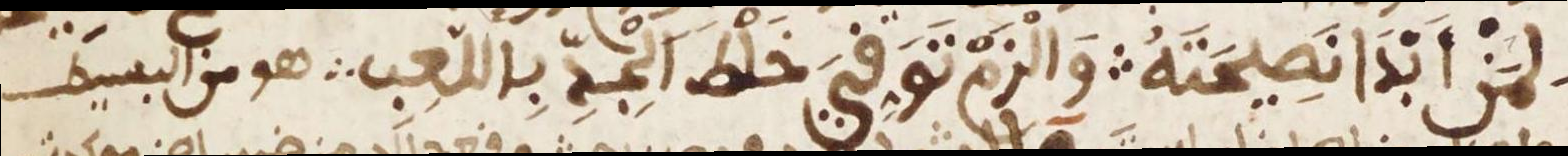لمن أبدا نصيحته و الزم توقي خلط الجد باللعب هو من البسيط
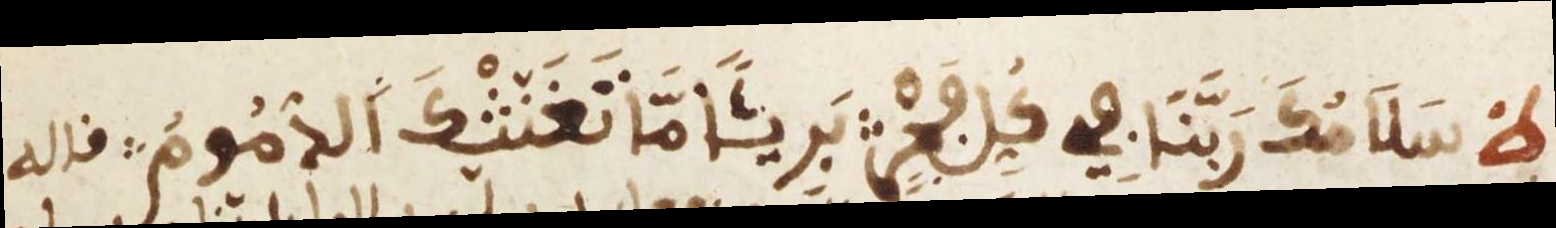ظ سلامك ربنا في كل فجر بريـئا ما تغنثك الذموم قاله
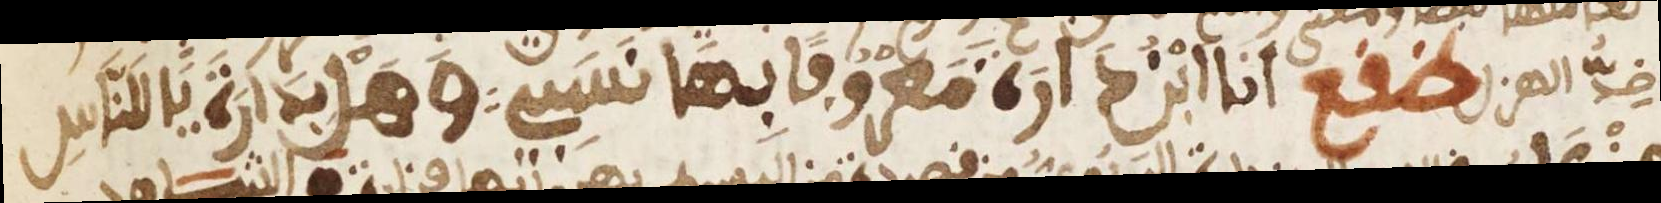ضد الهزل ظقع أنا ابن دارة معروفا بها نسبي وهل بدارة يا للناس
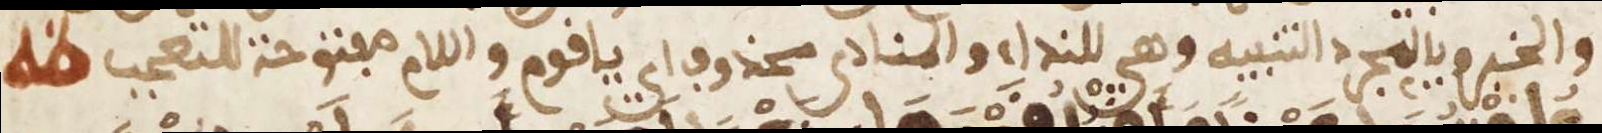و الخبر و يا لمجرد التنبيه و هي للنداء و المنادى محذوف اي يا قوم و اللام مفتوحة للتعجب ظه
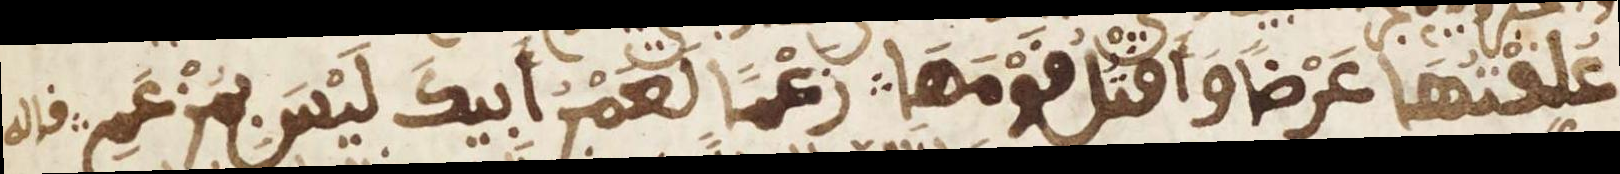علقتها عرضا و أقتل قومها زعما لعمر أبيك ليس بمزعم قاله
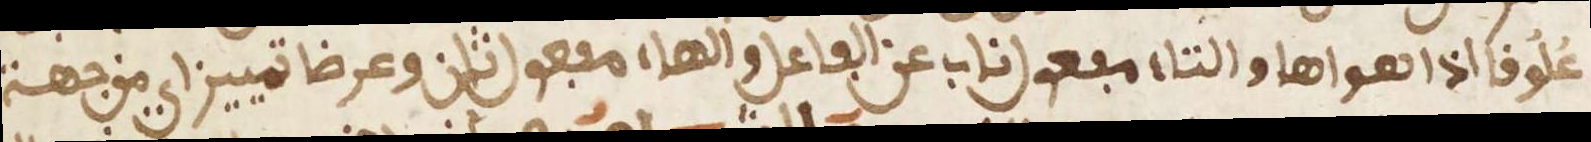علوقا اذا هواها و التاء مفعول ناب عن الفاعل و الهاء مفعول ثان و عرضا تمييز اي من جهة
